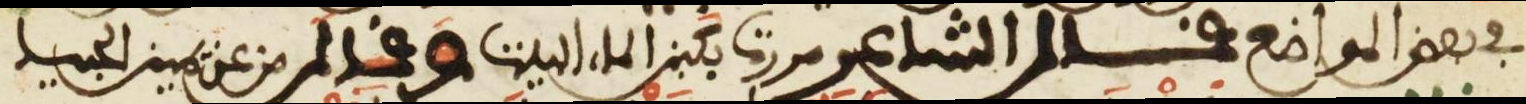في بعض المواضع قال الشاعر مررت بكبنر الماء البيت و قال من عن يمين الحبيا
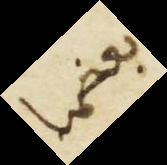للتكثير
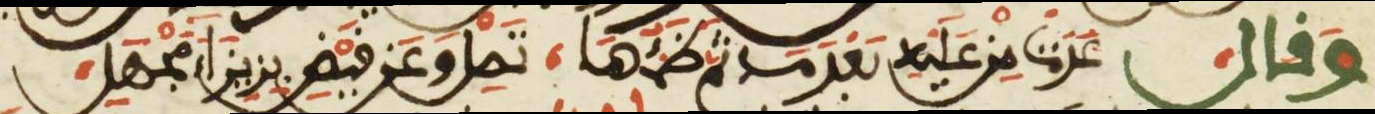وقال عدت من عليه بعد ما ثم ظمئها تصل و عم فيض بزيزاء مجهل
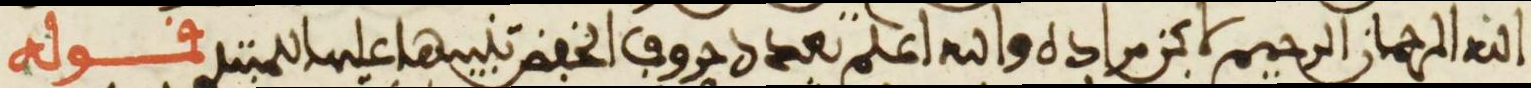الله الرحمان الرحيم لاكن مراده و الله اعلم تعده حروف الخفض تنبيها عليها للمبتدى قوله
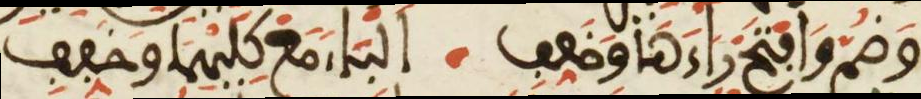و ضم و افتح راء ها وضعف - الباء مع كليهما و خفف
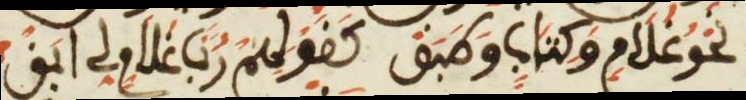نحو غلام و كتاب و طبق كقولهم رب غلام لي ابق
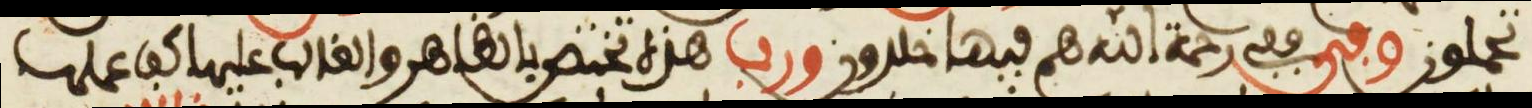تحملون وفى ففي رحمة الله هم فيها خلدون و رب هذه تختص باظاهر والغالب عليها كفاعلها
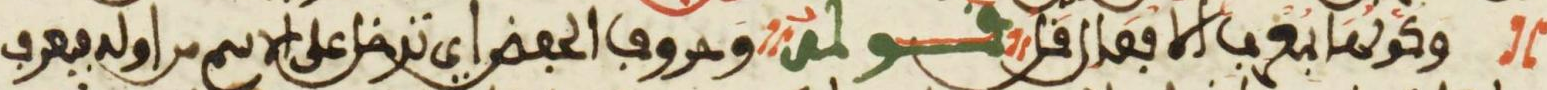وكونها بمعرب الأفعال قل قوله و حروف الخفض أي تدخل على الاسم من اوله فيعرف
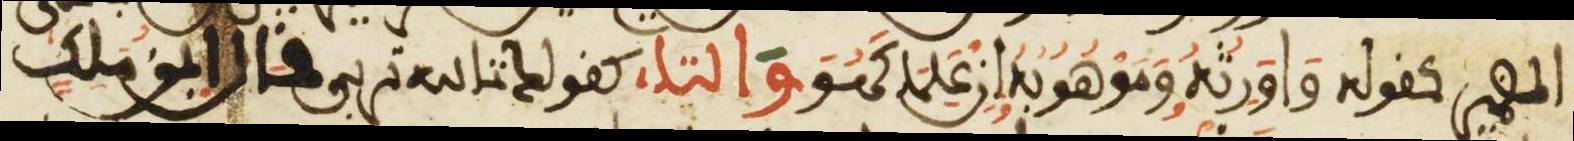الضمير كقوله و اورثه وموهو به ان علما كهو و التاء كقولك تالله تربى قال ابن ملك
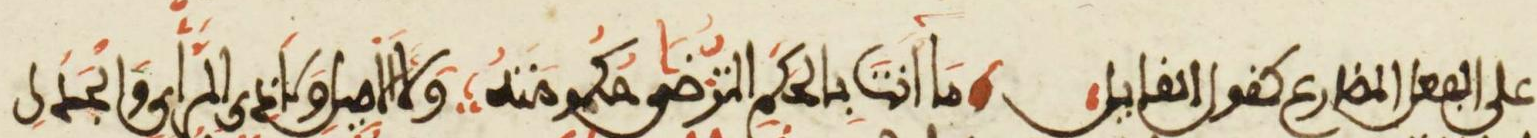على الفعل المضارع كقول القايل ما انت بالحكم الترضى حكومته و لا الأصيل و لا ذى الرأى و الجدل
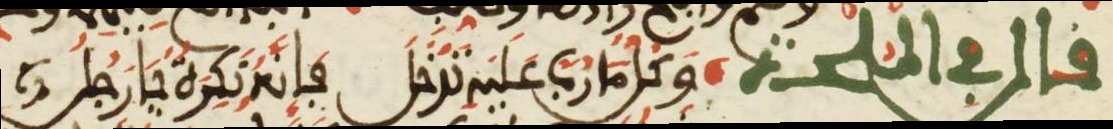قال في الملحة و كل ما رب عليه تدخل فانه نكرة يا رجل
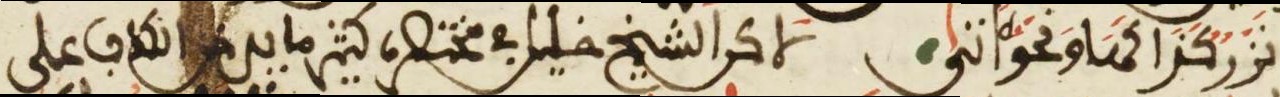نزر كذا كها و نحو أتى لاكن الشيخ خليل في مختصره كثير ما يد# الكذب على
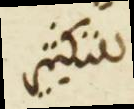بعضها
